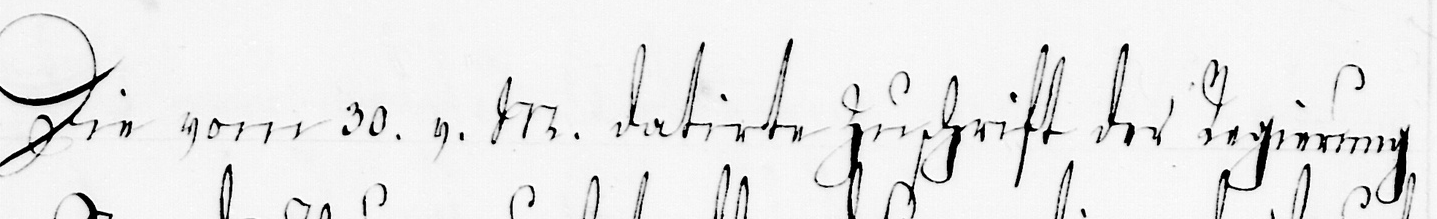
Die vom 30. v. M. datirte Zuschrift der Regierung
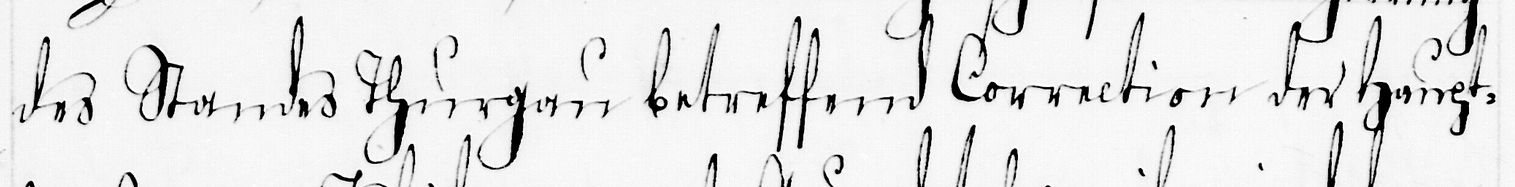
des Standes Thurgau betreffend Correction der Haupt¬
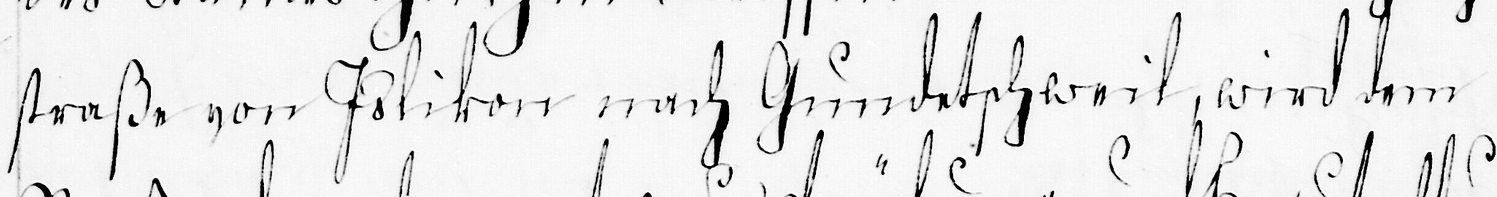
straße von Islikon nach Gundetschweil, wird dem
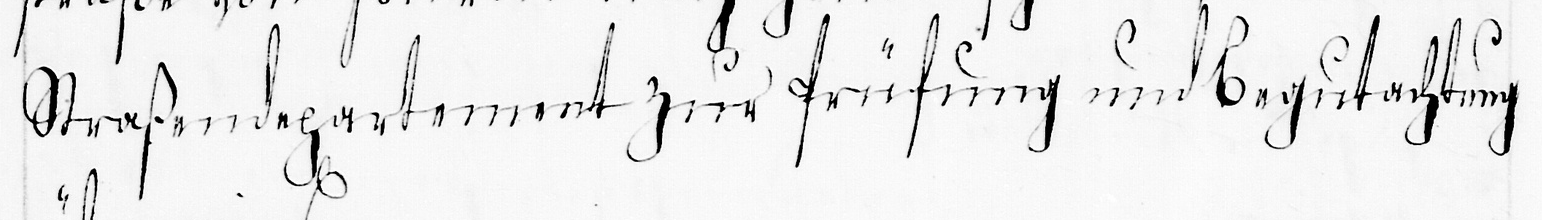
Straßendepartement zur Prüfung und Begutachtung
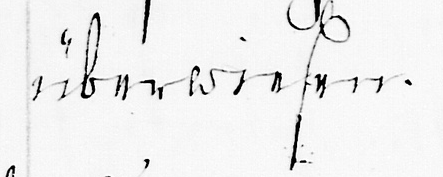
überwiesen.
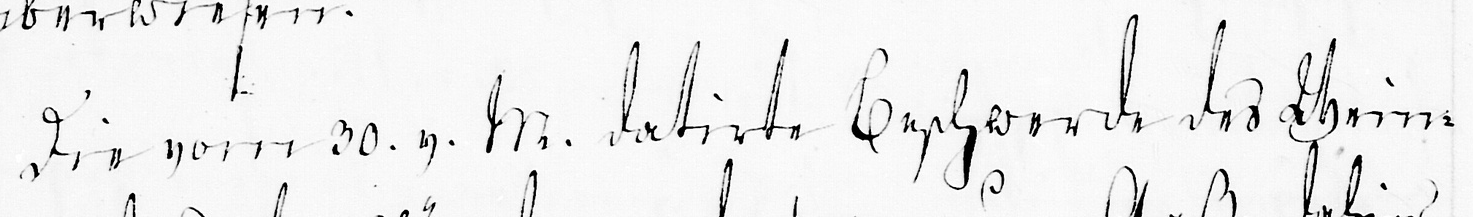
Die vom 30. v. M. datirte Beschwerde des Weins¬
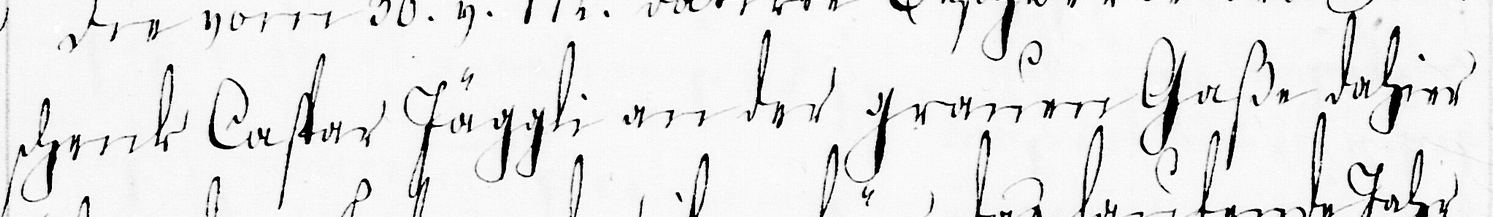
chenk Caspar Jäggli an der grauen Gaße dahier
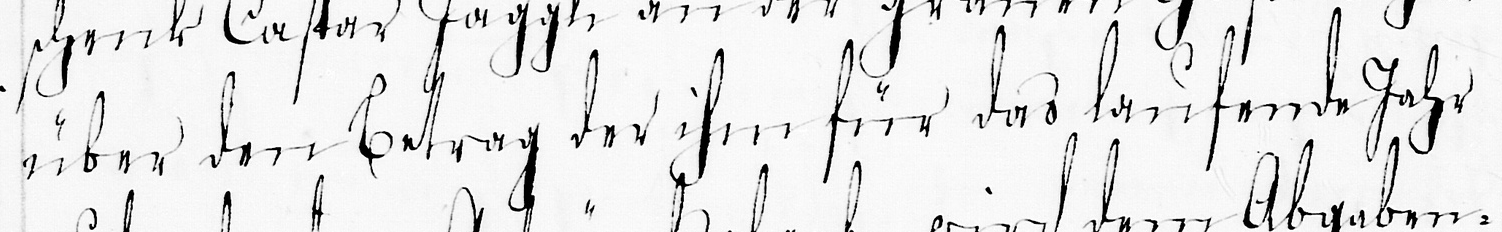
über den Betrag der ihm für das laufende Jahr
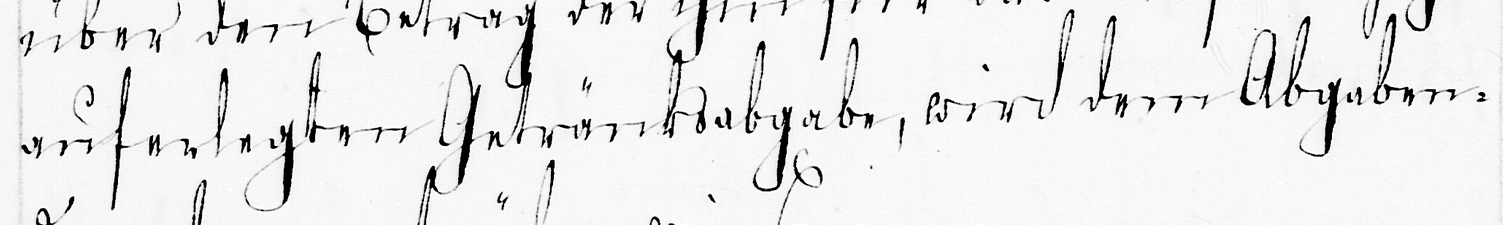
auferlegten Getränksabgabe, wird dem Abgabe¬
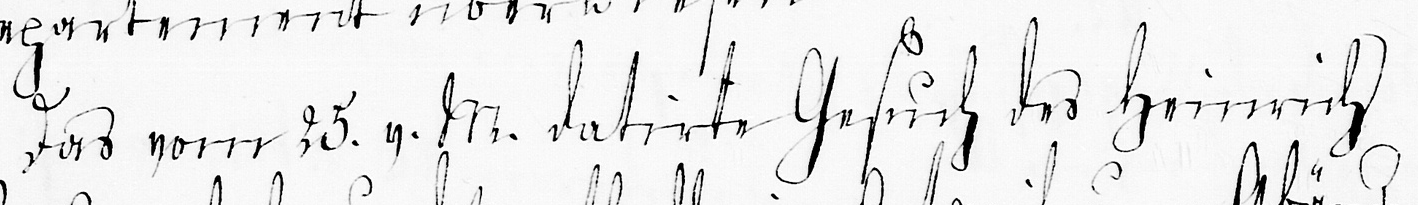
Das vom 25. v. M. datirte Gesuch des Heinrich
